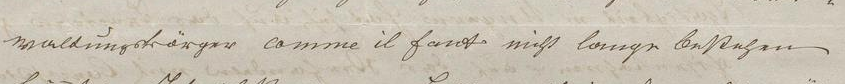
waltungskörper comme il faut nicht lange bestehen
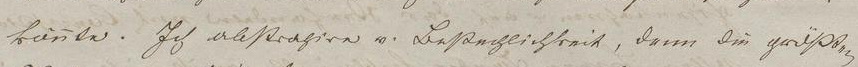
könnte. Ich abstrahire v. Bestechlichkeit, denn die größten
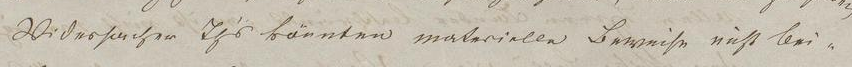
Widersacher Th's könnten materielle Beweise nicht bei-
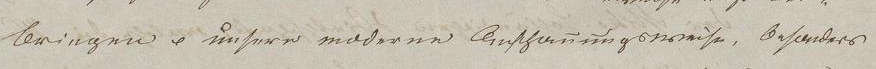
bringen & unsere moderne Anschauungsweise, besonders
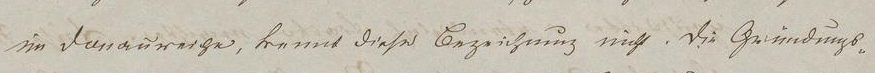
im Donaureiche, kennt diese Bezeichnung nicht. Die Gründungs-
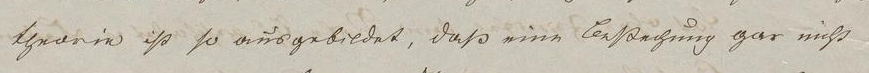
theorie ist so ausgebildet, daß eine Bestechung gar nicht
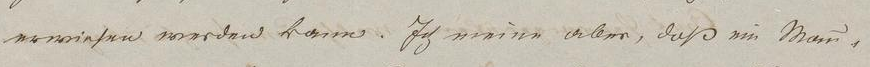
erwiesen werden kann. Ich meine aber, da ein Mann,
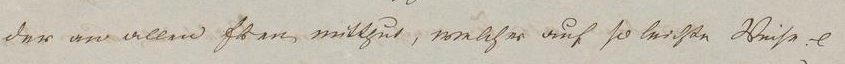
der an allen Eken mitthut, welcher auf so leichte Weise &
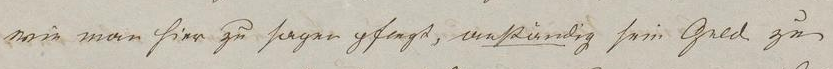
wie man hier zu sagen pflegt, anständig sein Geld zu
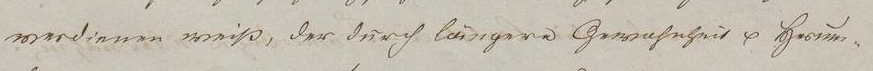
verdienen weiß, der durch längere Gewohnheit & Herum-
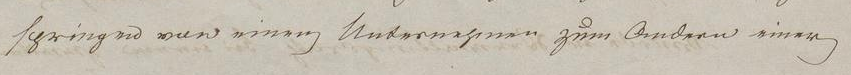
springen von einem Unternehmen zum Andern einer
